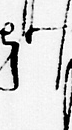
en
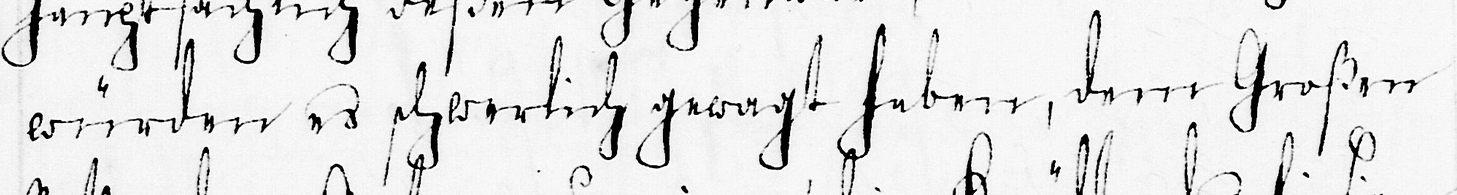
würden es schwerlich gewagt haben, dem Großen
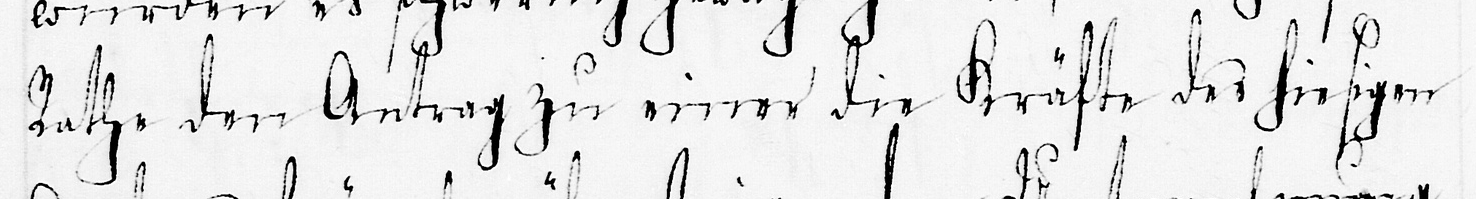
Rathe den Antrag zu einer die Kräfte des hiesigen
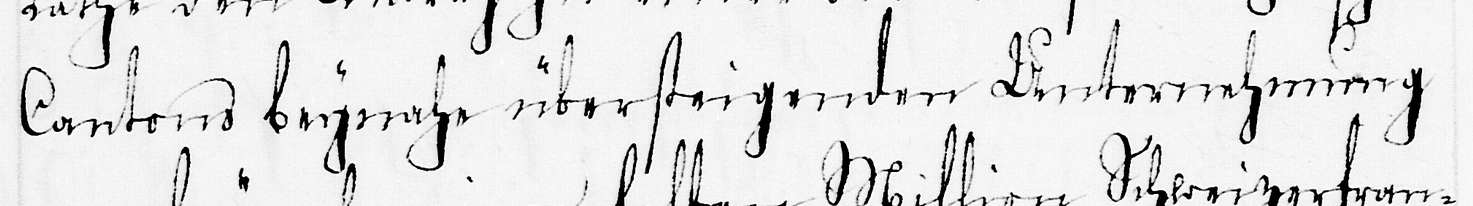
Cantons beynahe übersteigenden Unternehmung
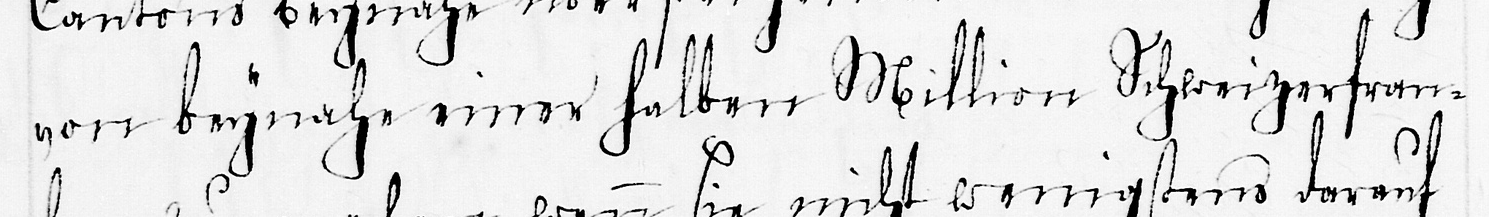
von beynahe einer halben Million Schweizerfran¬
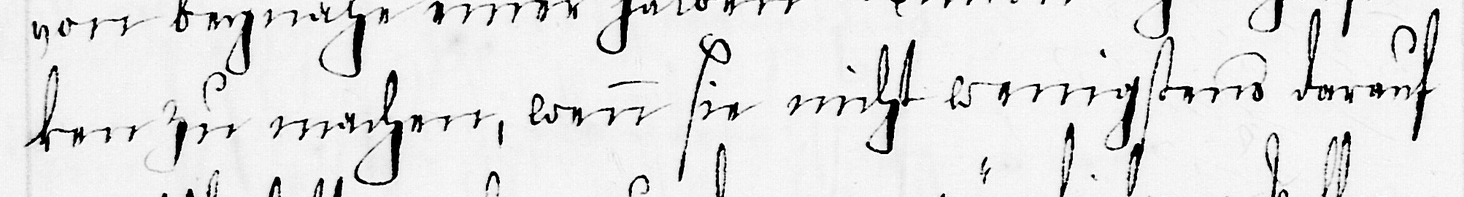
ken zu machen, wenn sie nicht wenigstens darauf
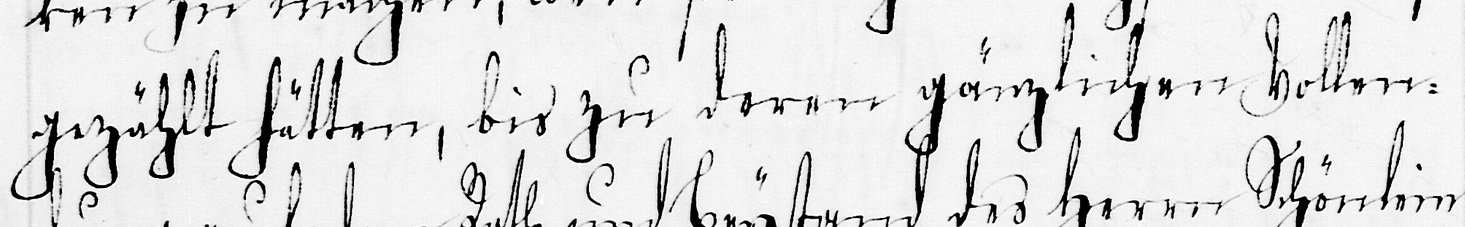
gezählt hätten, bis zu deren gänzlichen Vollen¬
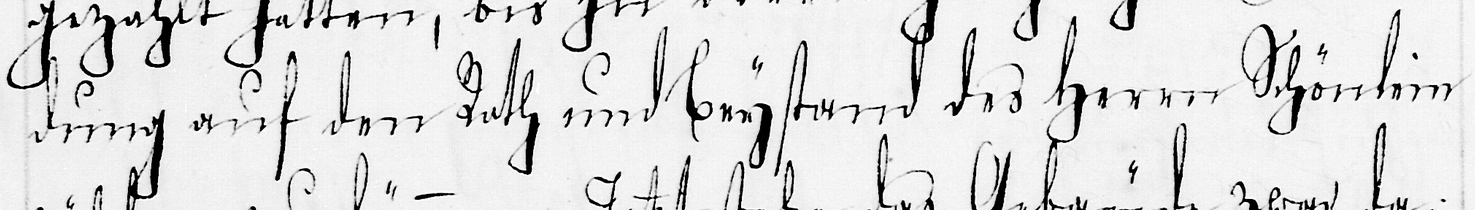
dung auf den Rath und Beystand des Herrn Schönlein
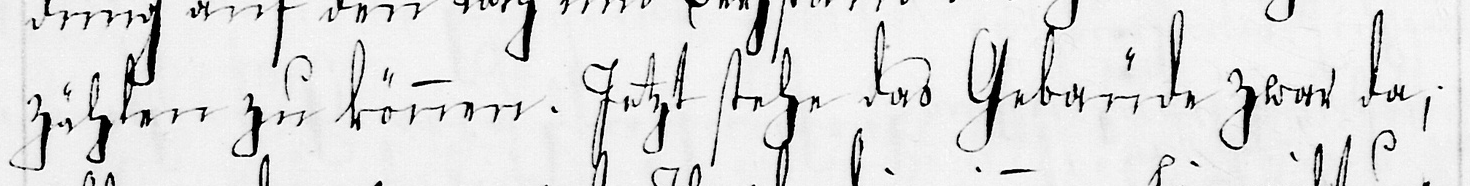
zählen zu können. Jetzt stehe das Gebäude zwar da;
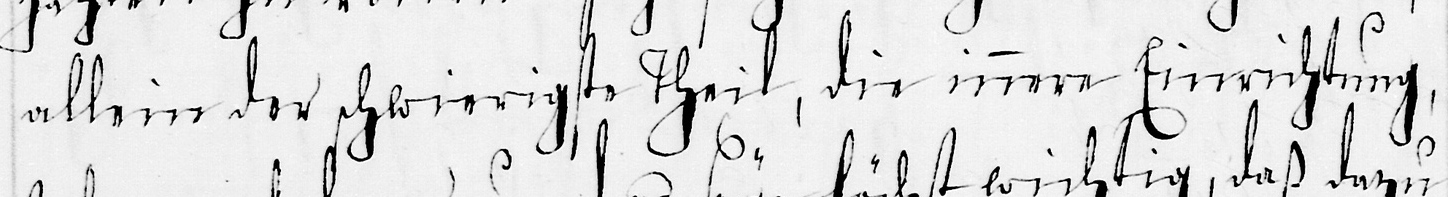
allein der schwierigste Theil, die innere Einrichtung,
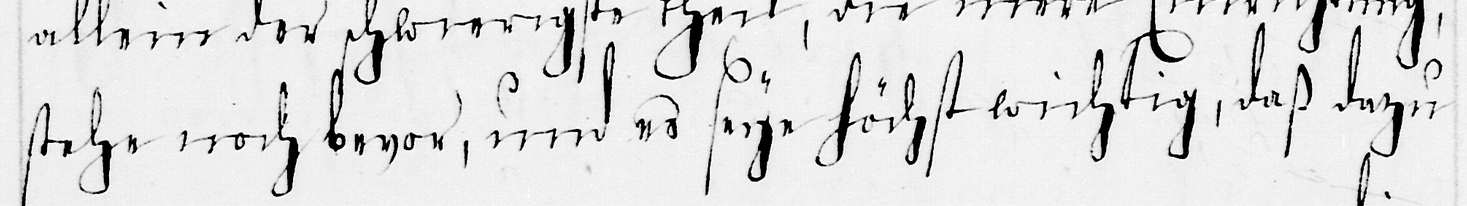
stehe noch bevor, und es seye höchst wichtig, daß dazu
